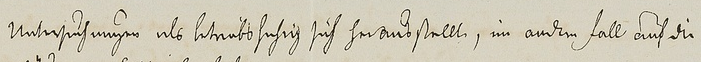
Untersuchungen als betriebsfähig sich herausstellt, im andern Fall auf die
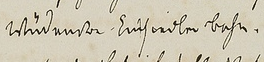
Wädensweil–Einsiedler Bahn.
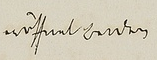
eröffnet werden
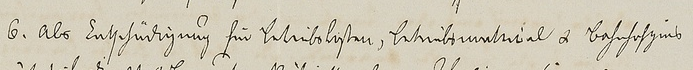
6. Als Entschädigung für Betriebskosten, Betriebsmaterial & Bahnhofzins
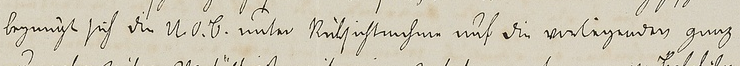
begnügt sich die N.O.B. unter Rücksichtnahme auf die vorliegenden ganz
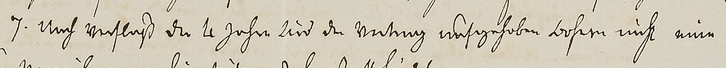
7. Nach Verfluß der 4 Jahre wird der Vertrag aufgehoben wofern nicht eine
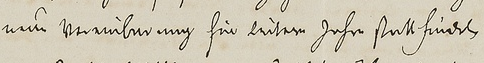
neue Vereinbarung für weitere Jahre statt findet.
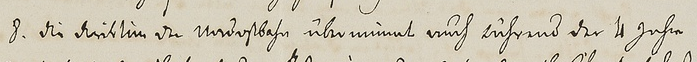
8. Die Direktion der Nordostbahn übernimmt auch während der 4 Jahre
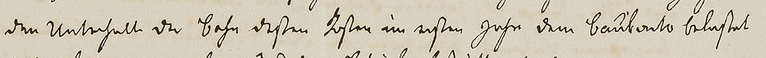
den Unterhalt der Bahn deßen Kosten im ersten Jahr dem Baukonto belastet
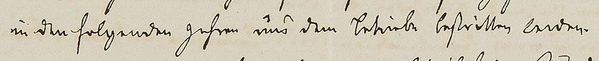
in den folgenden Jahren aus dem Betriebe bestitten werden.
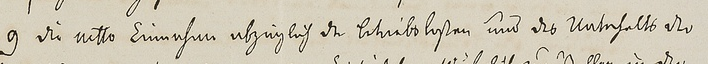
9. Die Netto Einnahmen abzüglich der Betriebskosten und des Unterhalts der
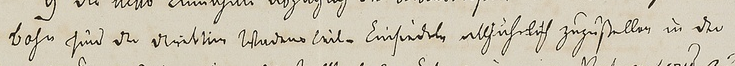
Bahn sind der Direktion Wädensweil–Einsiedeln alljährlich zuzustellen in der
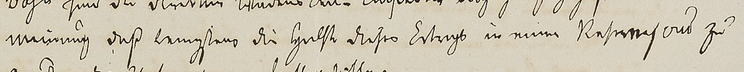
Meinung daß wenigstens die Hälfte dieses Ertrags in einen Reservefond zu
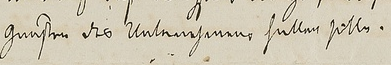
Gunsten des Unternehmens fallen solle.
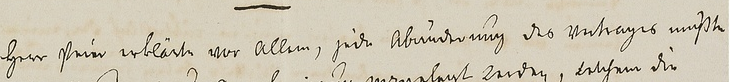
Herr Peier erklärte vor Allem, jede Abänderung des Vertrags müßte
